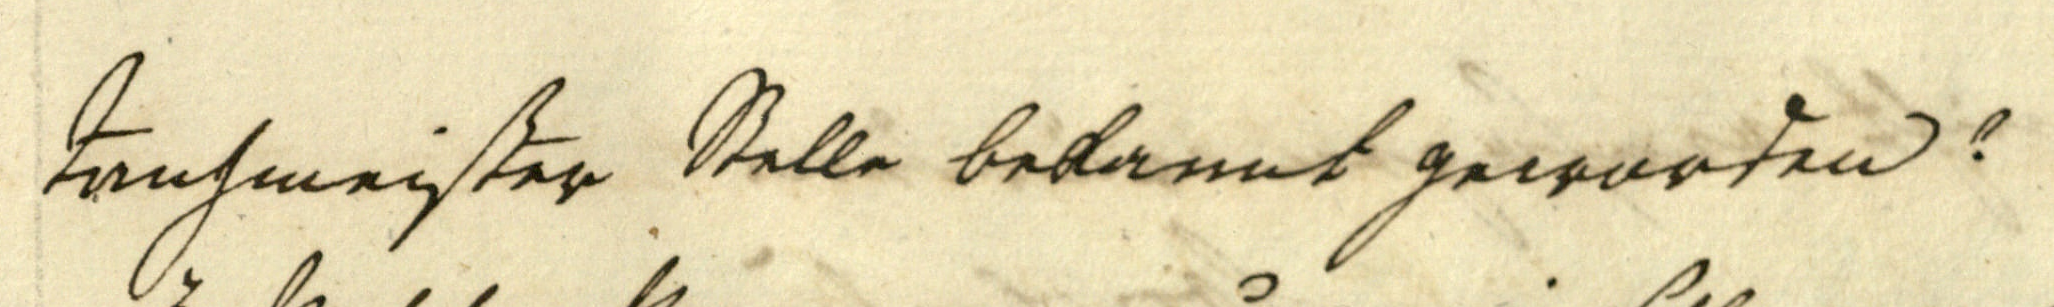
Tanzmeister Stelle bekannt geworden?
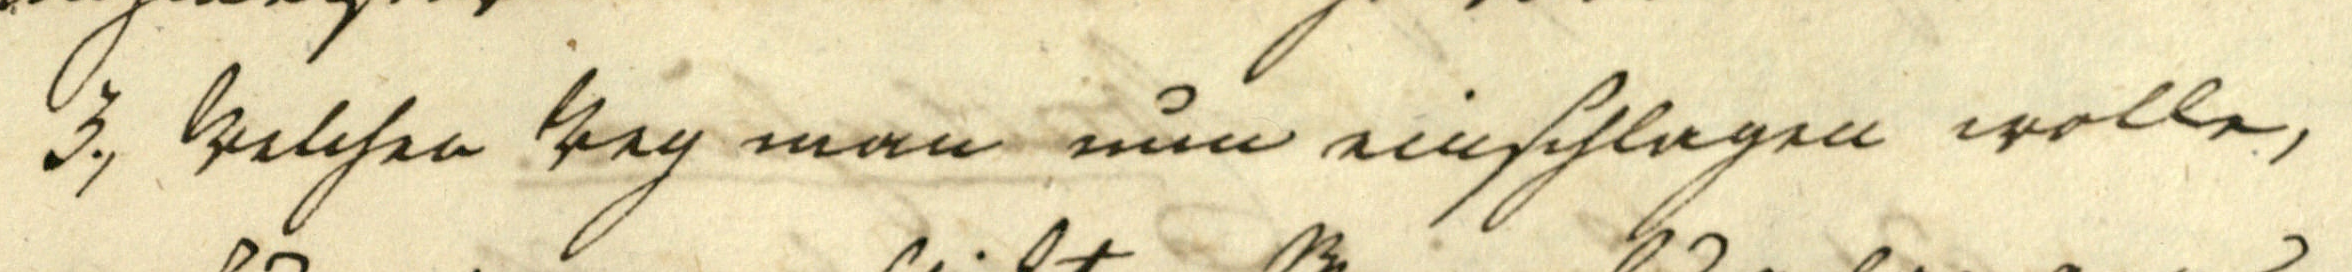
3., Welchen Weg man nun einschlagen wolle,
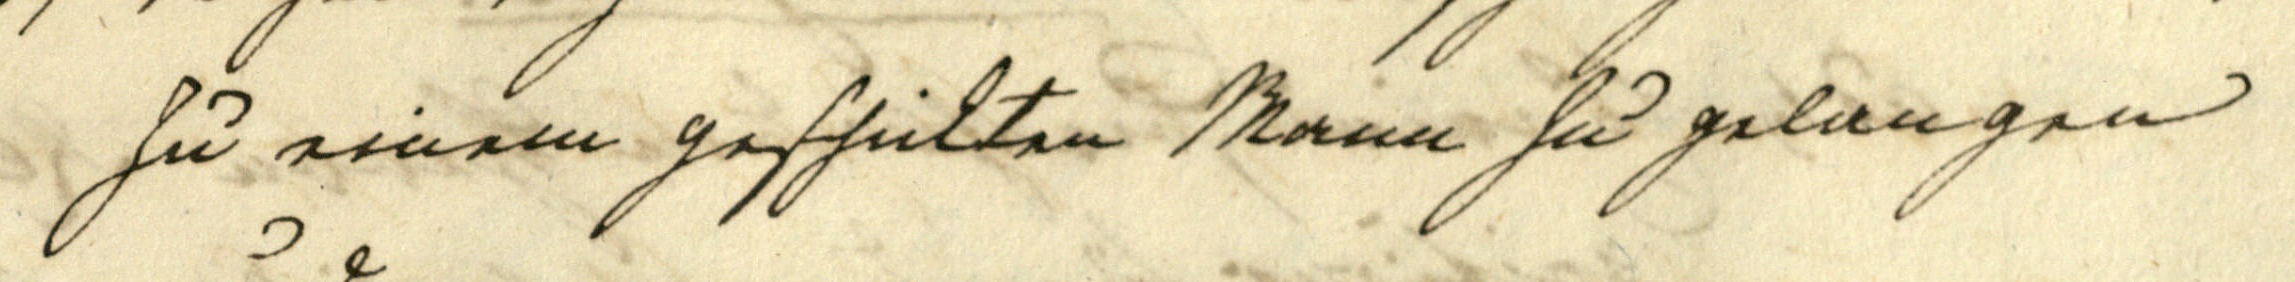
zu einem geschickten Mann zu gelangen
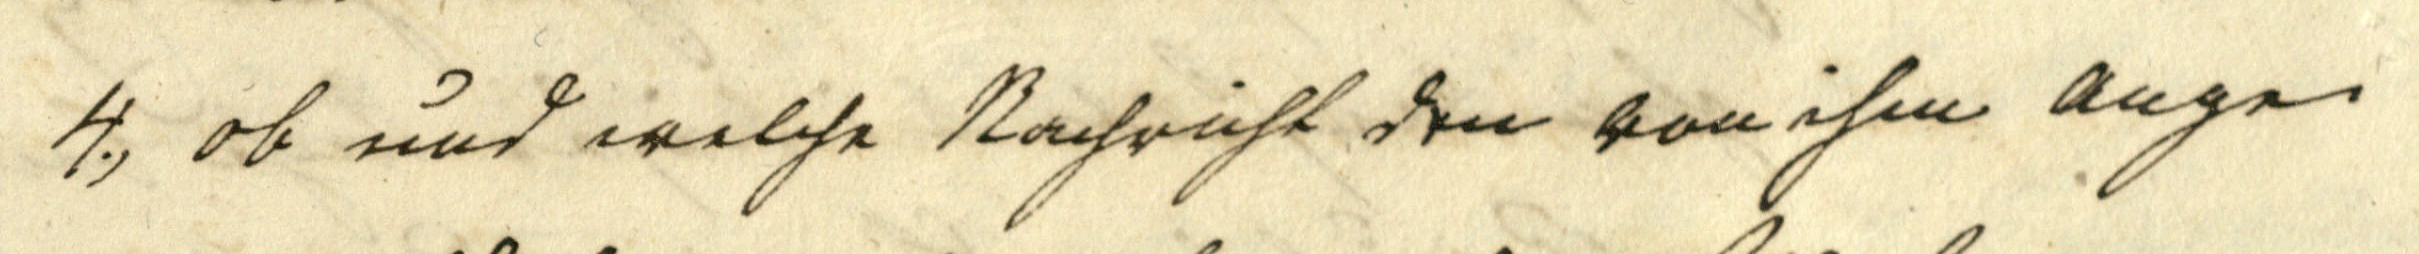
4., ob und welche Nachricht den von ihm Ange¬
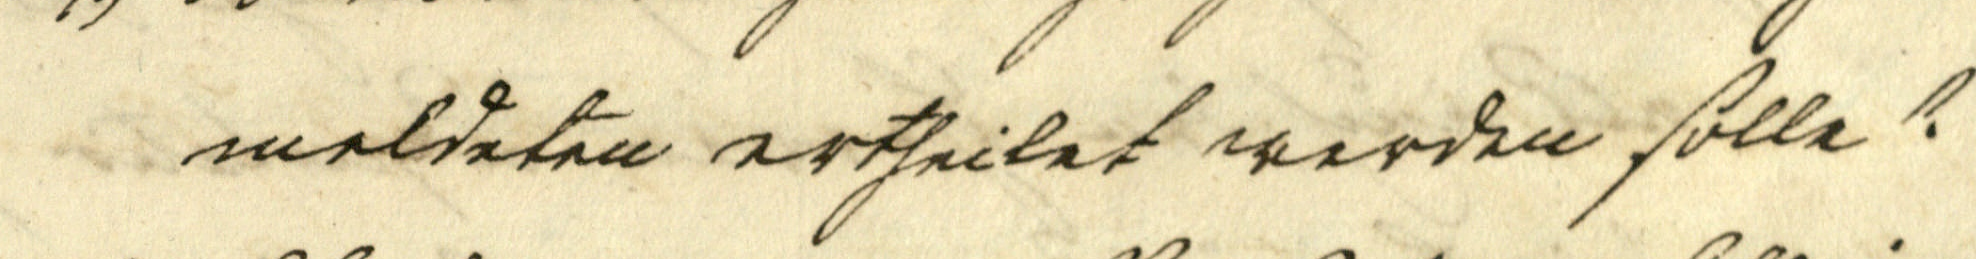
meldeten ertheilet werden solle?
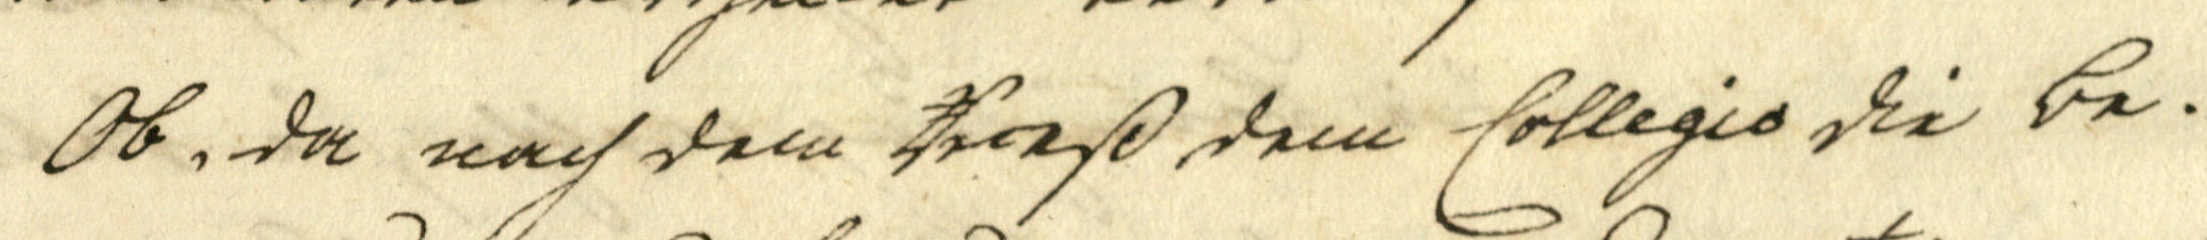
5., Ob, da nach dem Receß dem Collegio die Be¬
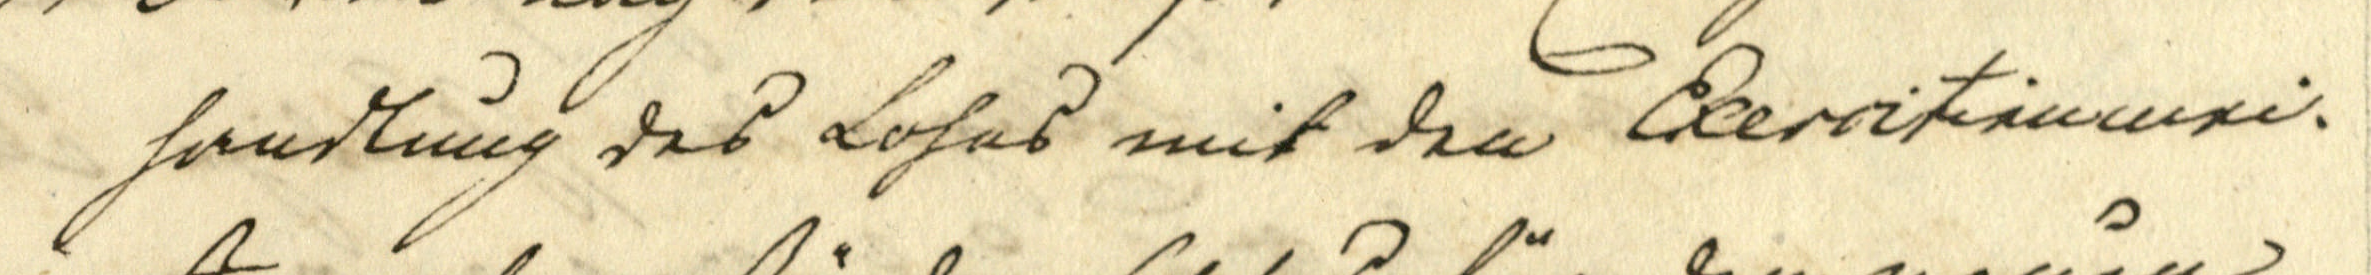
handlung des Lohns mit den Exercitienmei¬
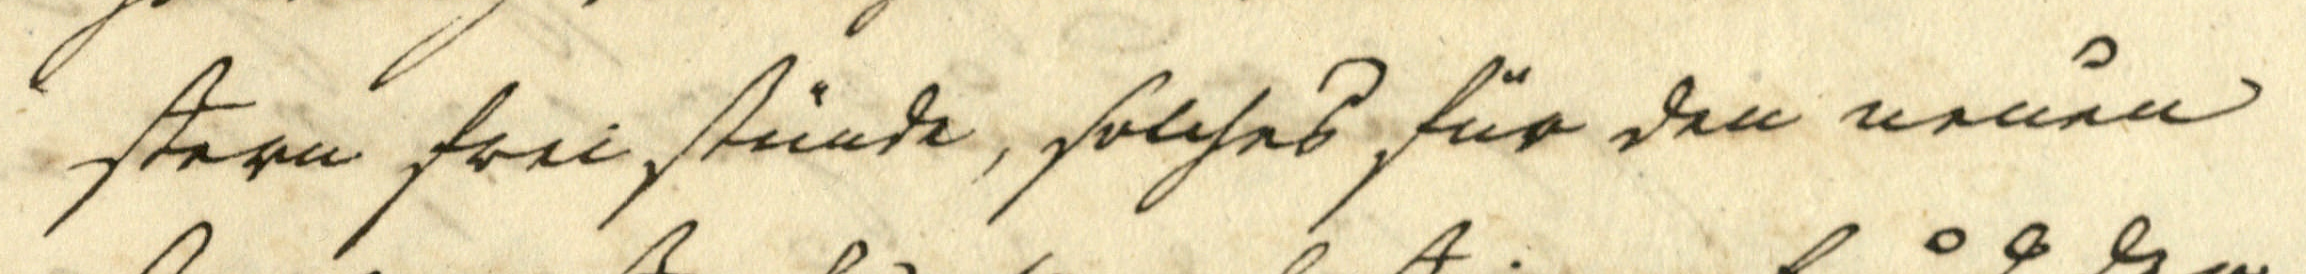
stern frei stünde, solches für den neuen
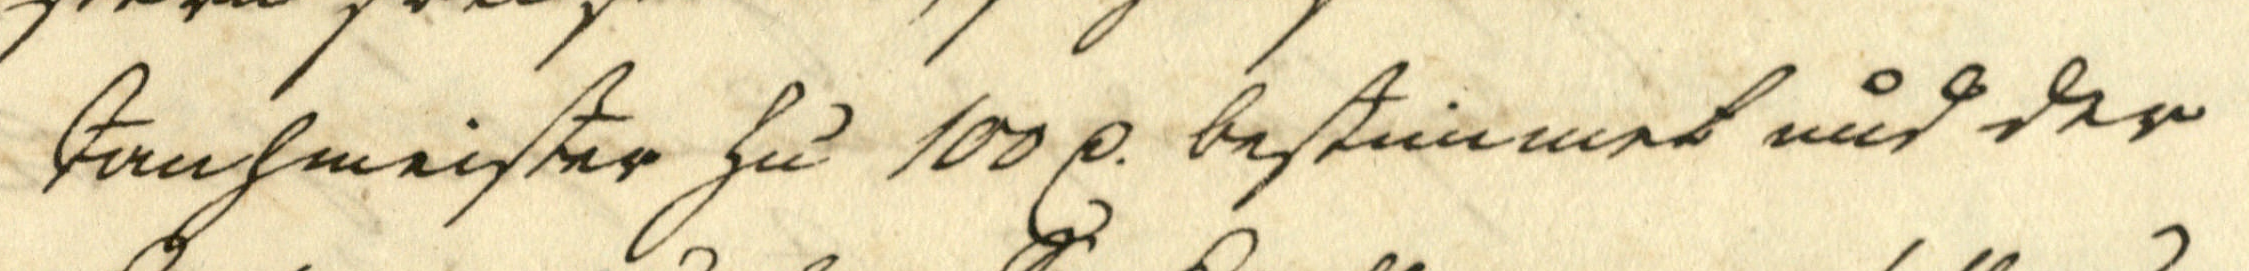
Tanzmeister zu 100 l. bestimmet und der
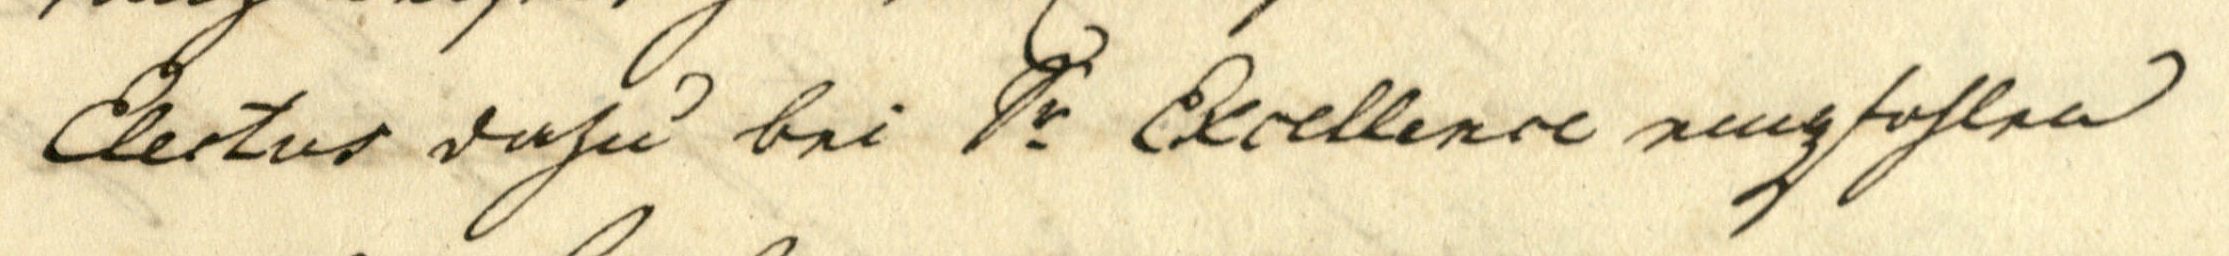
Electus dazu bei Sr Excellence empfohlen
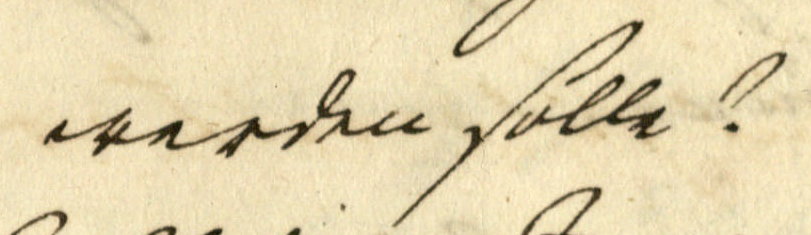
werden solle?
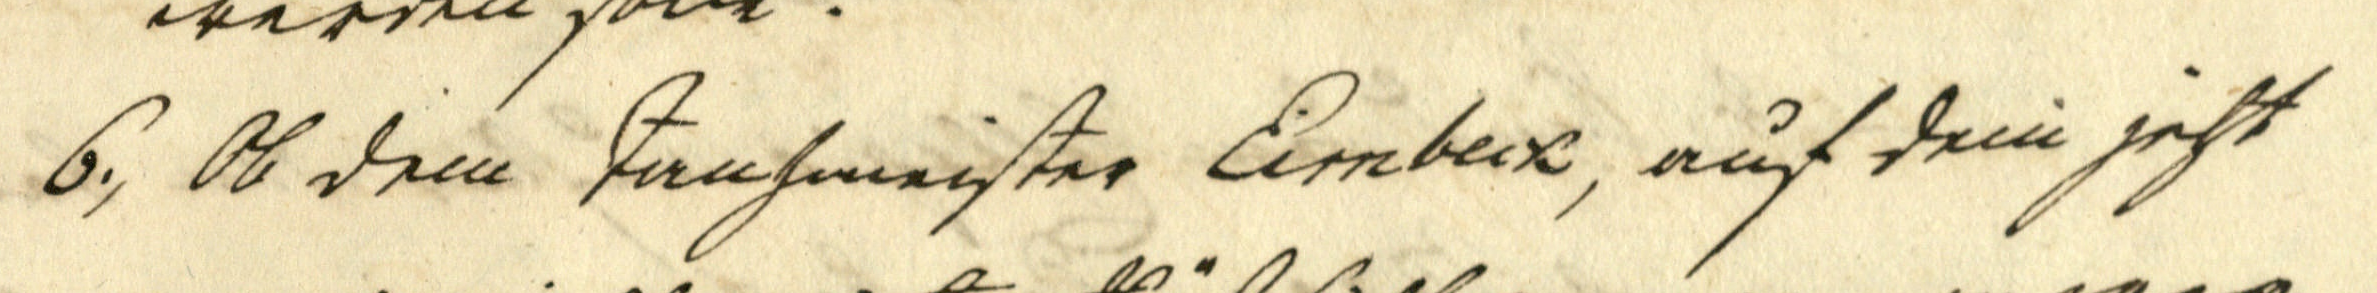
6., Ob dem Tanzmeister Eimbeck, auf dem jetzt
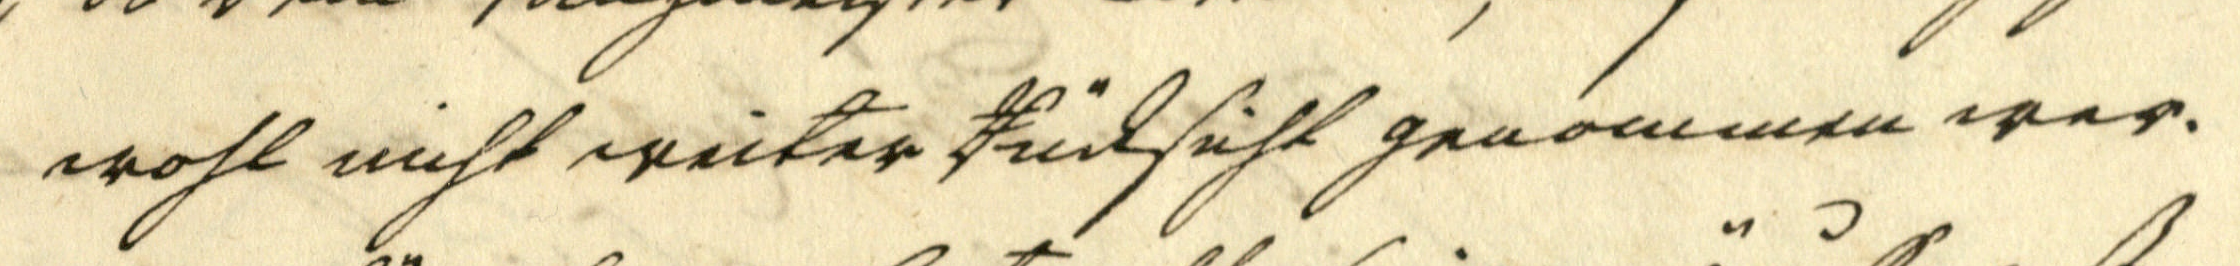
wohl nicht weiter Rücksicht genommen wer¬
